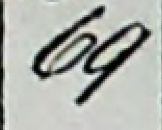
69
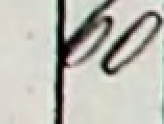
60
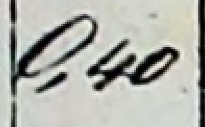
0,40
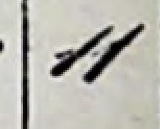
11
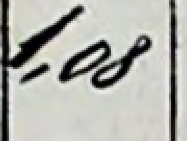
1,08
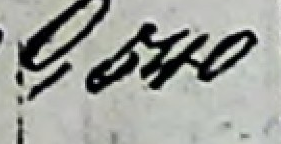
0,540
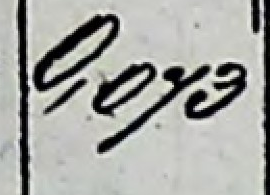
0,073
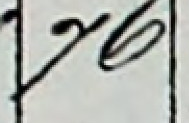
76
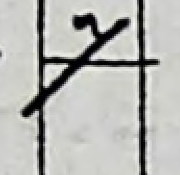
7
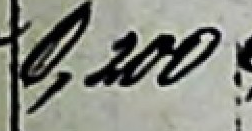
0,200
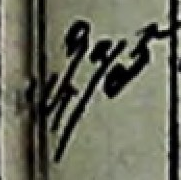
3,75
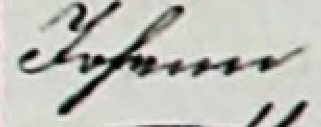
Johann
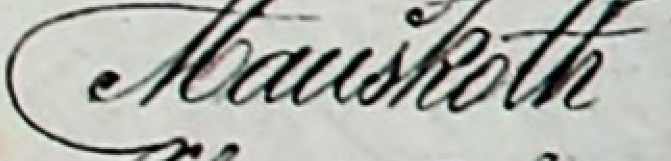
Mauskoth
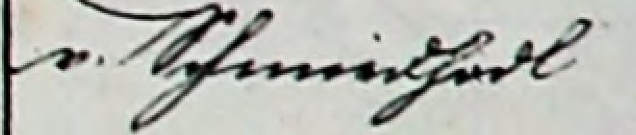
v. Schmiedhadl
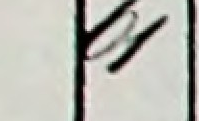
61
